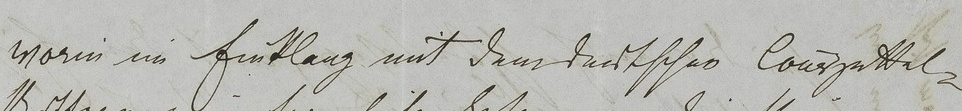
worin im Einklang mit dem deutschenCourszettel -
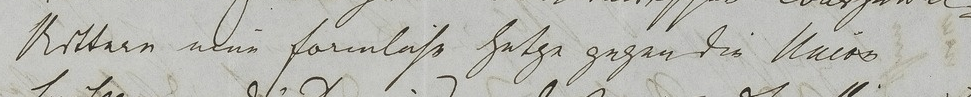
Rittern eine förmliche Hetze gegen die Union
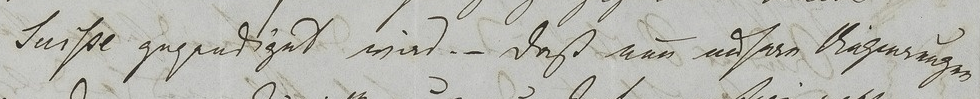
Suisse geprediget wird. – Daß nun unsere Regierungen
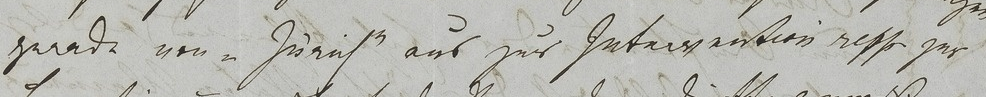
gerade von «Zürich» aus zur Intervention resp zur
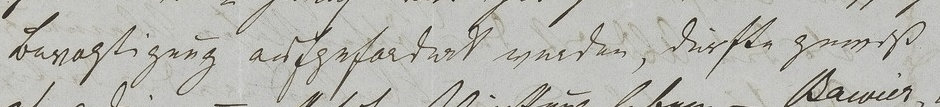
Bevogtigung aufgefordert werden, dürfte gewiß
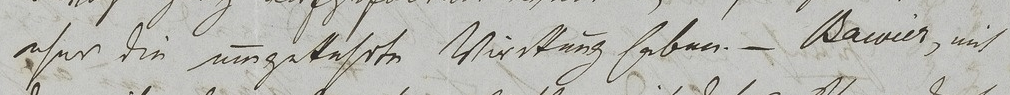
eher die umgekehrte Wirckung haben. – Bawier, mit
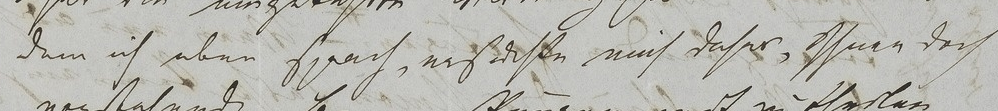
dem ich eben sprach, ersuchte mich daher, Ihnen doch
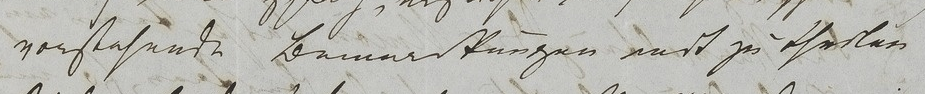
vorstehende Bemerkungen mit zu theilen.
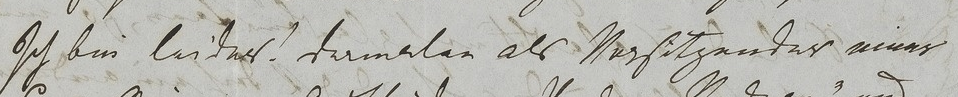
Ich bin leider! dermalen als Vorsitzender einer
